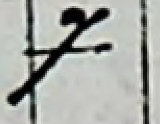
7
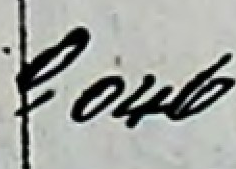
0,046
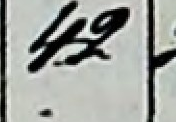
42
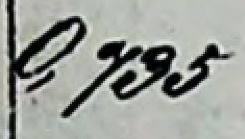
0,735
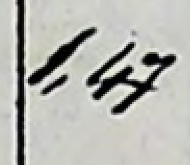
1,47
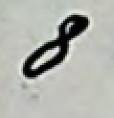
8
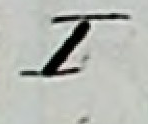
I
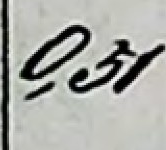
0,51
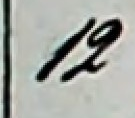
12
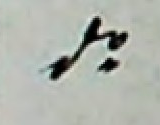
do
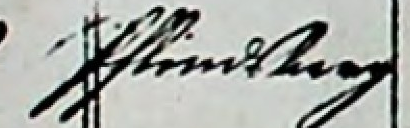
Pflindsberg
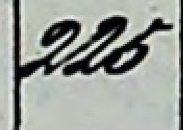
225
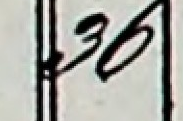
36
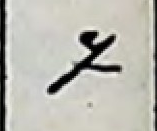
7
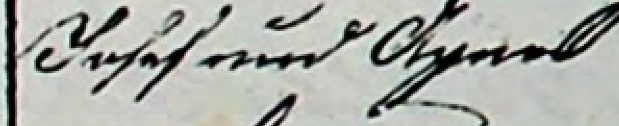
Josef und Agnes
